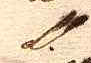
d.o
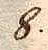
8.
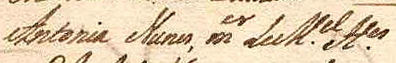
Antonia Nunes, mer de M.el H.es
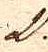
d.o
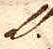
d.o
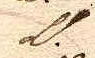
d.o
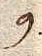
9.
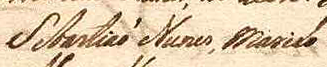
Sebastiaõ Nunes, marido
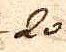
20.
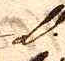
d.o
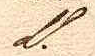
d.o
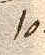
10.
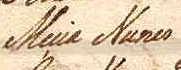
Meçia Nunes
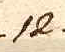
12.
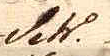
Setr.o
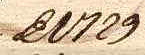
d̄ 1729
